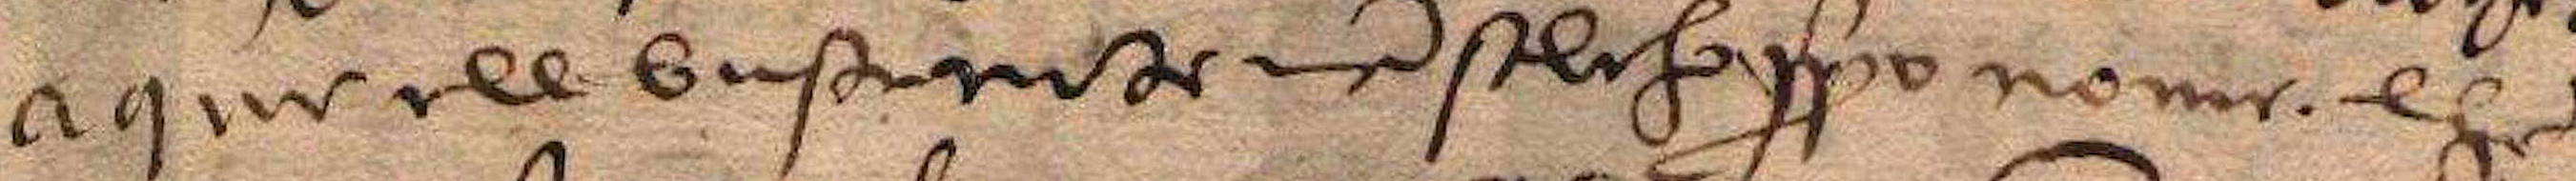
a que elle bustamte nā sabe ho ꝓpio nome. lhe
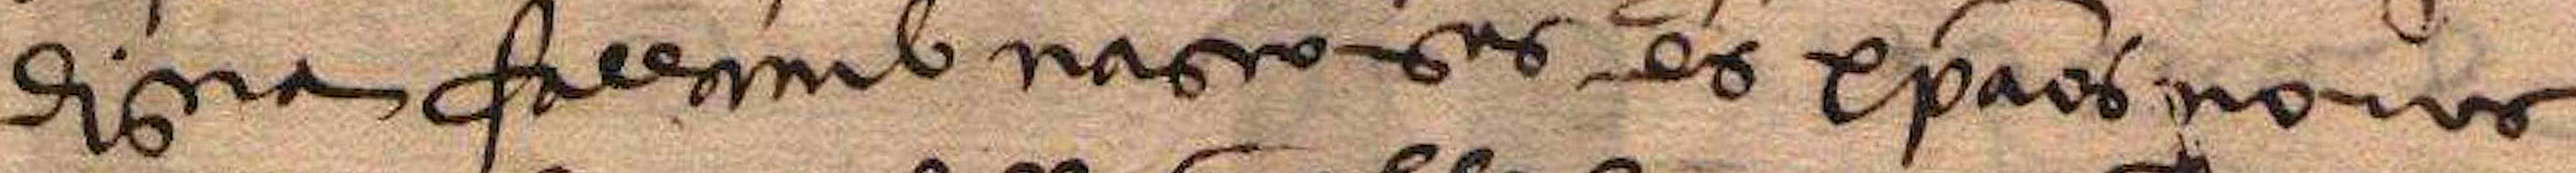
disera fallando nas cousas dos xpãos nouos
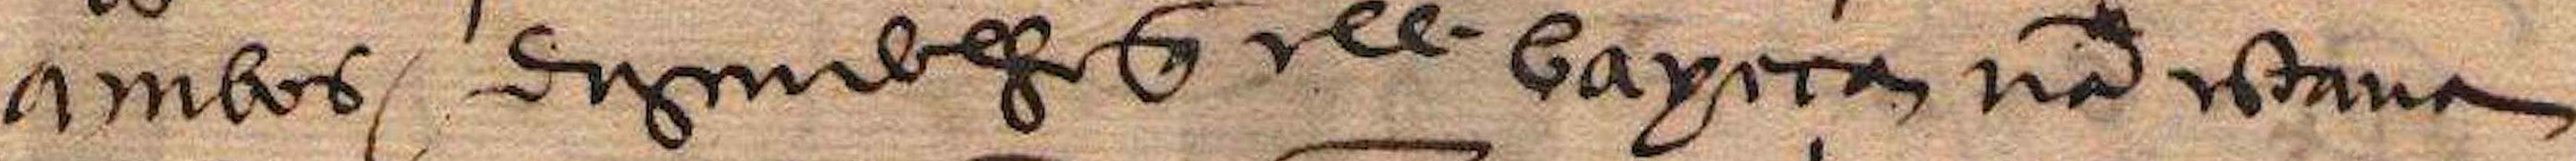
ambos / dizendolhe q̄ elle bayeça nā estaua
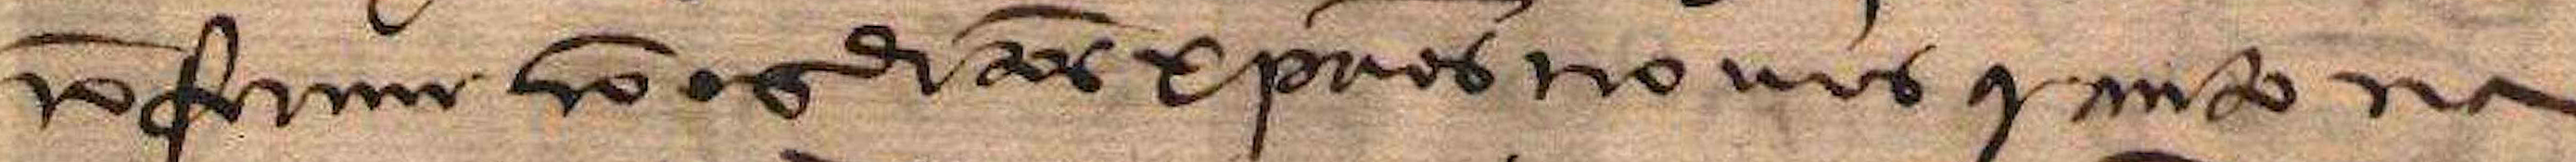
c̄oforme c̄o os ditos xpãos nouos quanto era
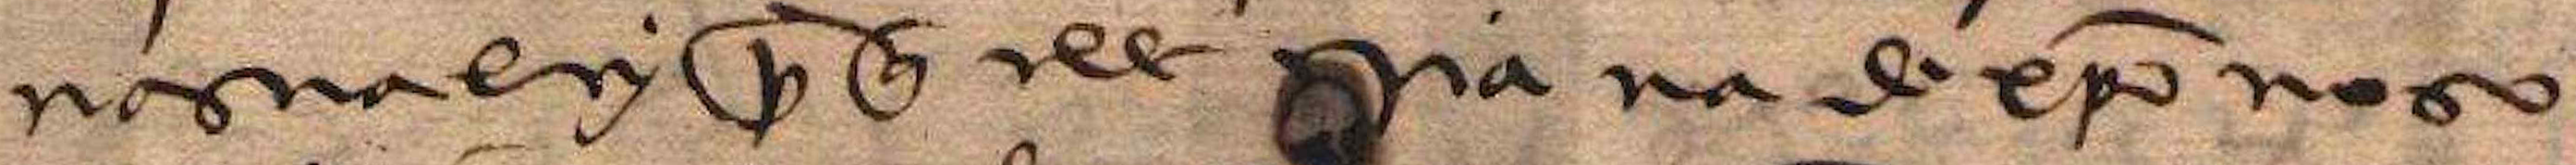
na sua ley p̄q̄ elle cria na de xp̄o noso
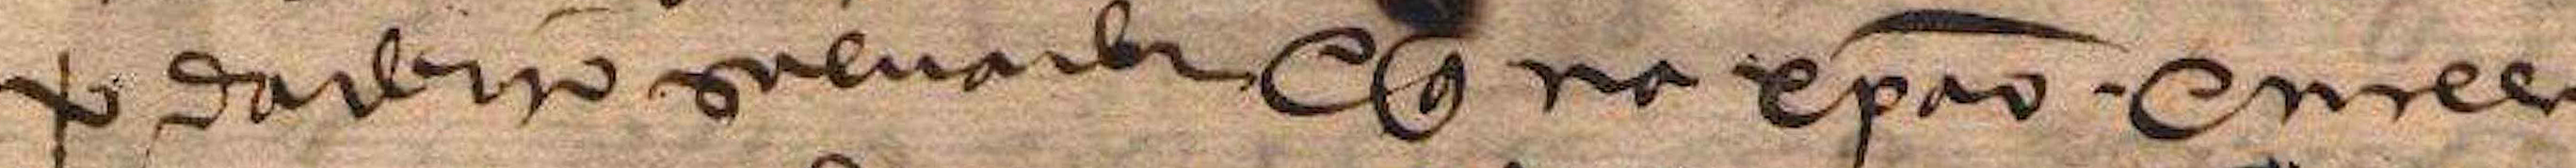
ꝟdadeiro saluador e q̄ era xpão. e nella
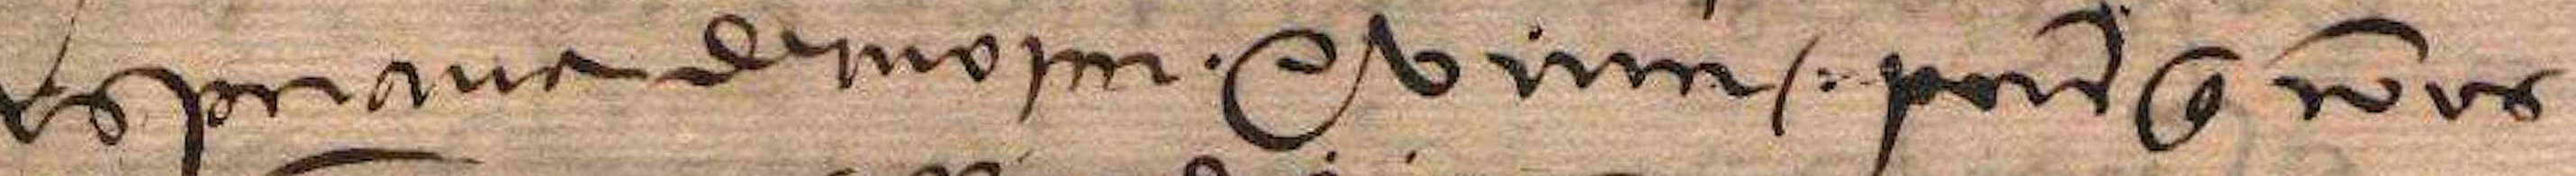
esperaua de morer. e viuer /. porē q̄ cō os
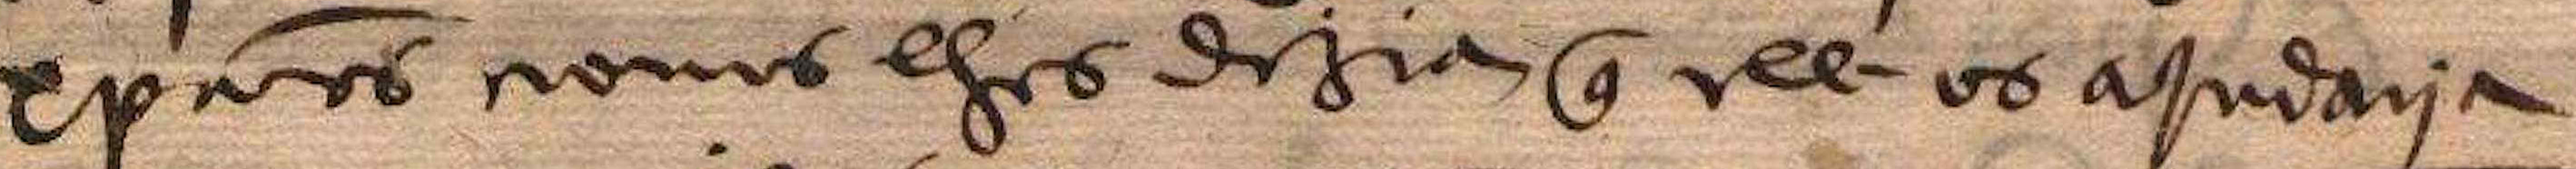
xpaõs nouos lhes dezia que elle os aJudarja
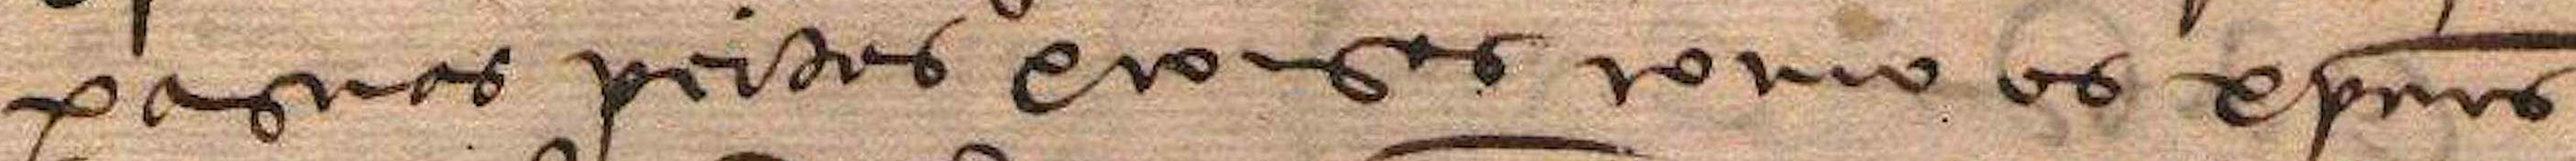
ꝑa suas peitas e cousas como os xpãos
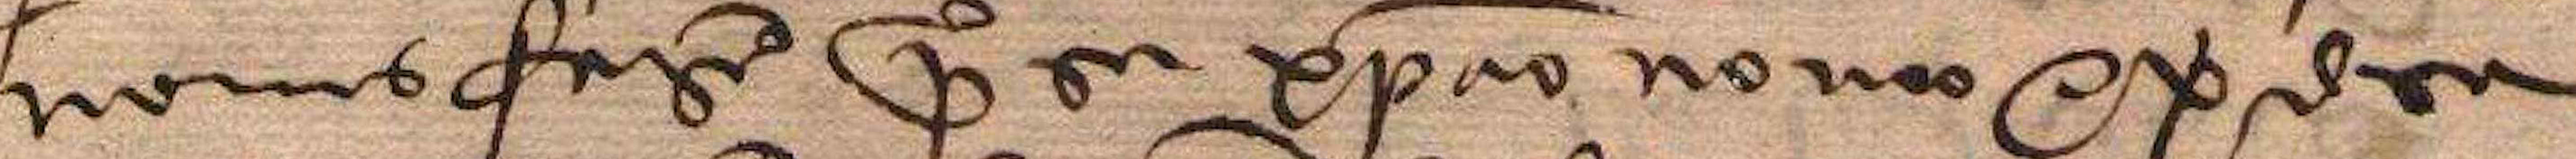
nouos fazem̄ p̄o ser xpão nouo e ꝟ desa
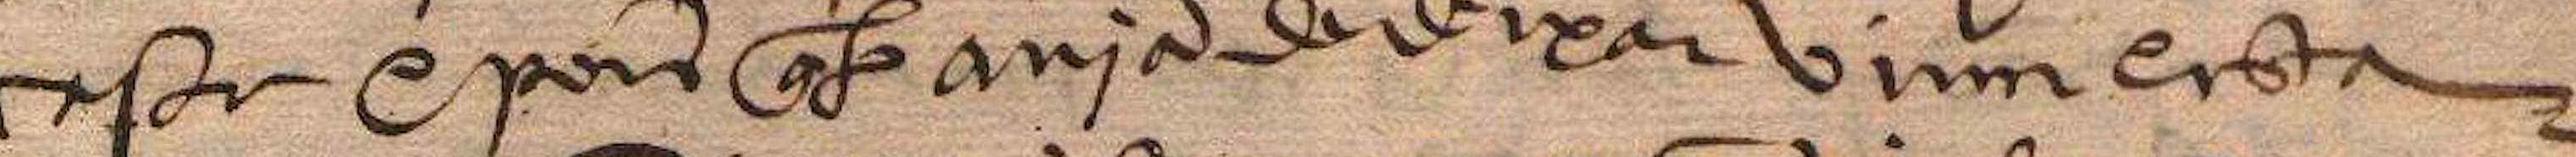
casta e porē q̄ ho aujā de deixar viuer e estar
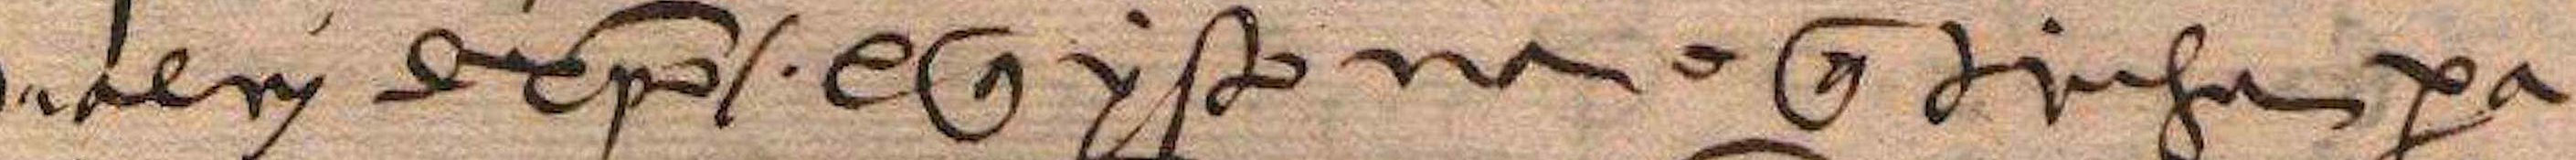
na ley de xp̄o /. e q̄ ysto era o q̄ tinha ꝑa
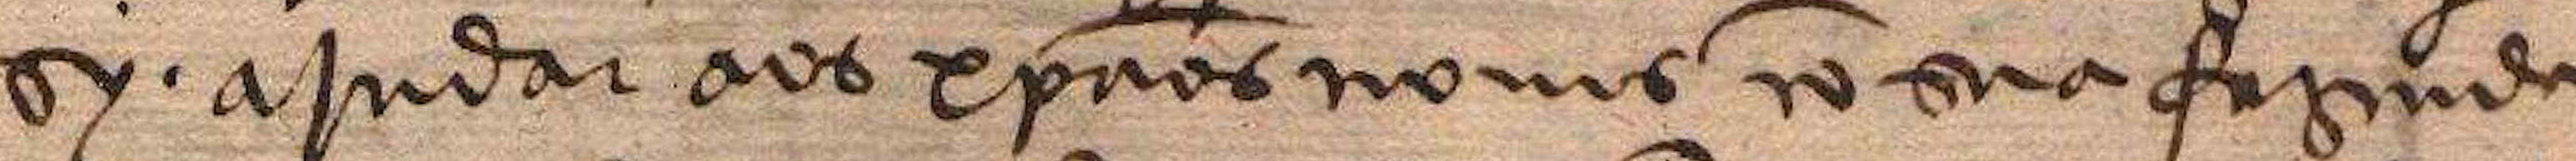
sy. aJudar aos xpãos nouos c̄o sua fazenda
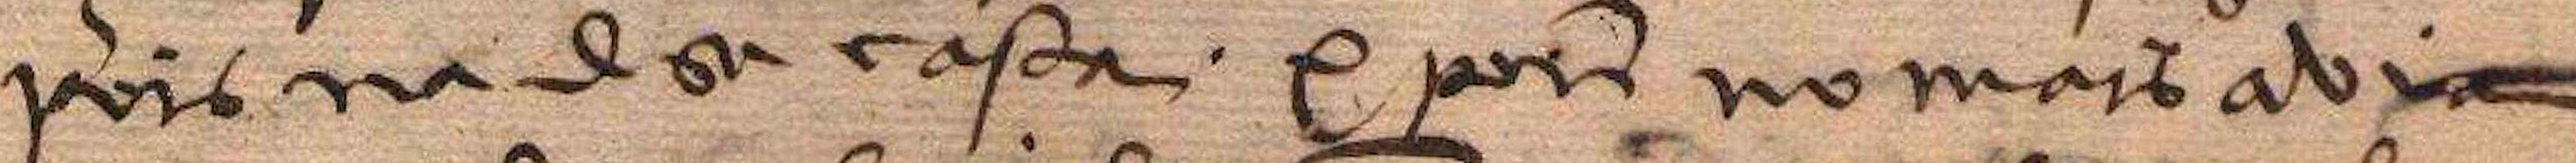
pois era desa casta. e porē no mais avia
